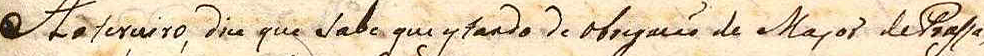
Ao terçeiro, dice que sabe que estando de obrigacão de Major de Prassa,
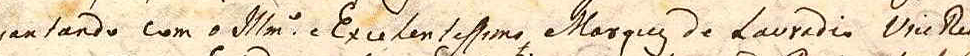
jantando com o Illm.o e ExceLentissimo Marquez de Lavradio Vice Rei
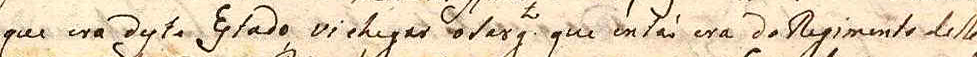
que era deste Estado, vi chegar o sarg.to que entaõ era do Regimento delle
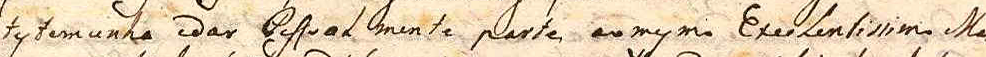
testemunha e dar Pessoalmente parte, ao mesmo ExceLenttisismo Mar
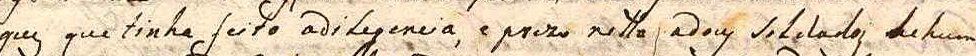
quez que tinha feito a diLegencia, e prezo nella a dous soLdadoz de hum
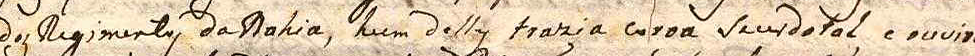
doz Regimentos da Bahia, hum delles trazia coroa sacerdotal, e ouvira
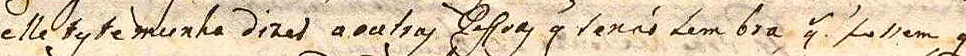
elle testemunha dizer a outras Pessoas q̄ senaõ Lembra, q̄ fosem, q̄
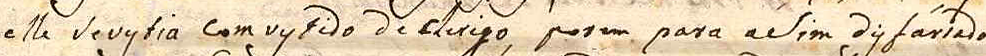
elle se vestia com vestido de cLerigo, porem para asim disfarsado
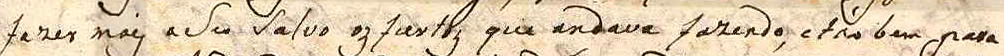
fazer mais a seo salvo oz furtoz que andava fazendo, e tãobem para
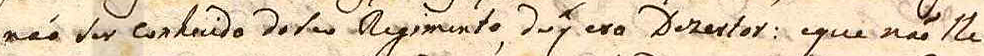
naõ ser conhecido do seo Regimento, do qL era Dezertor: e que naõ lhe
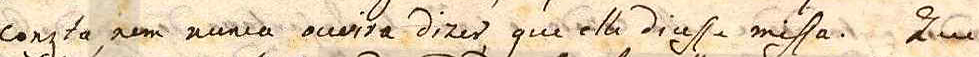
conzta, nem nunca ouvira dizer, que elle dicesse missa. Que
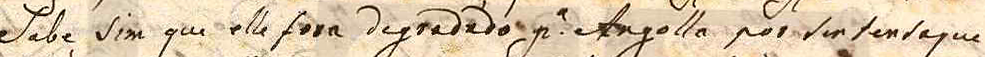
Sabe sim que elle fora degradado p.a Angolla por sentensa que
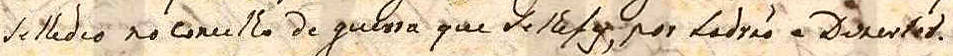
se lhedeo no concelho de guerra que se lhefes, por Ladraõ e Dezertor.
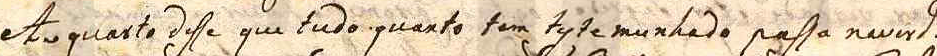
Ao quarto disse que tudo tem testemunhado passa na verd.e
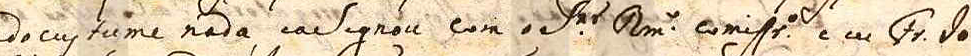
e do custume nada, e asignou com o S.or Rm.o comissr.o e eu Fr. Io
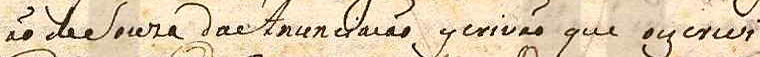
ão de Souza da Anunciacão escrivão que o ezcrevi
